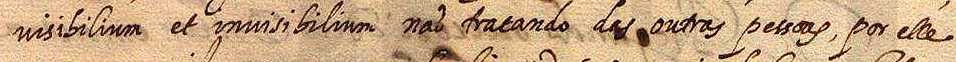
uisibilium et inuisibilium naõ tratando das outras pessoas, por elle
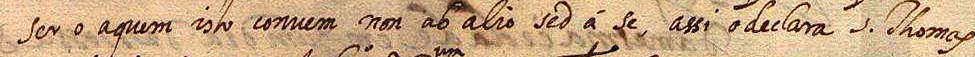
ser o a quem isto conuem non ab alio sed á se, assi o declara s. Thomas
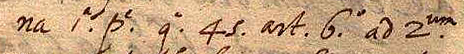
na 1.a pe. q. 45. art. 6.o ad 2.um
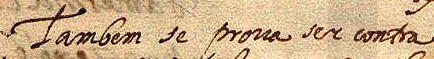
Tambem se proua ser contra
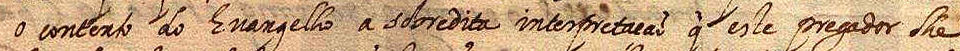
o contexto do Euangelho a sobredita interpretaçaõ q̄ este pregador lhe
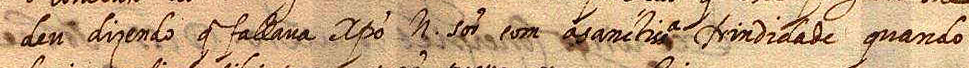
deu dizendo q̄ fallaua Xpō N. sor̄ com a sanctissa trindidade quando
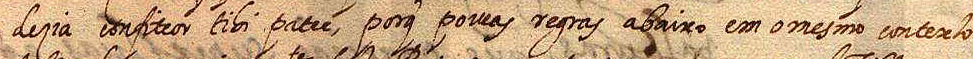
dezia confiteor tibi pater, porq̄ poucas regras abaixo em o mesmo contexto
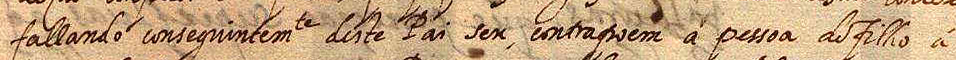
fallando conseguintemte deste Pai seu, contrapoem a pessoa do filho á
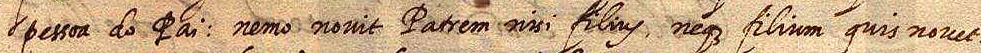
pessoa do Pai: nemo nouit Patrem nisi filius, neq̄ filium quis nouet
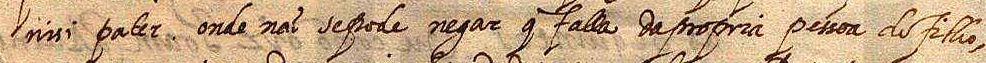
nisi pater. onde naõ se pode negar q̄ falla da propria pessoa do filho,
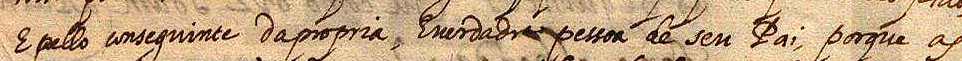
E pello conseguinte da propria, E uerdadra pessoa de seu Pai, porque as
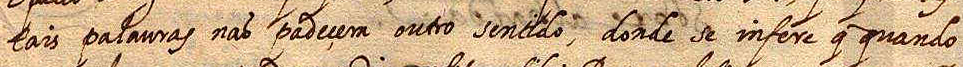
tais palauras naõ padecem outro sentido, donde se infere q̄ quando
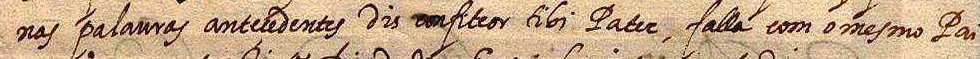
nas palauras antecedentes dis confiteor tibi Pater, falla com o mesmo Pai
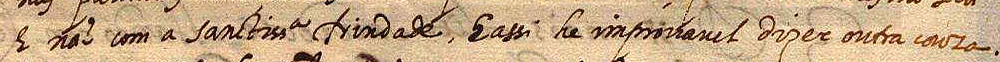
E naõ com a sanctissa trindade, E assi he improuauel dizer outra couza.
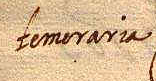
temeraria
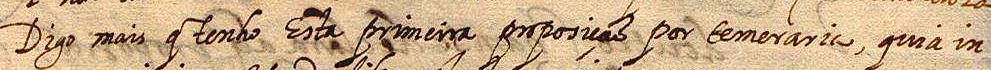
Digo mais q̄ tenho Esta primeira proposiçaõ por temeraria, quia in
